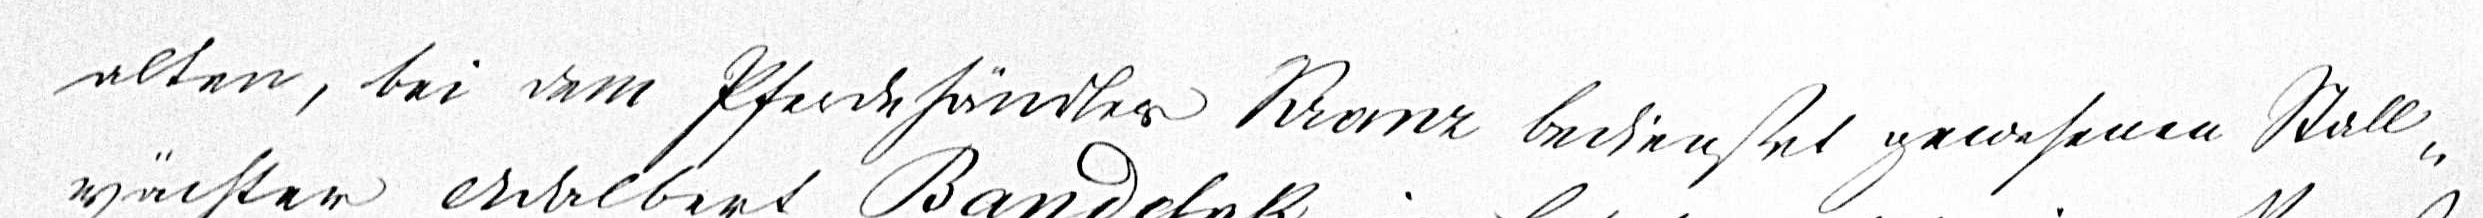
alten, bei dem Pferdehändler Kranz bedienset gewesenen Stall¬
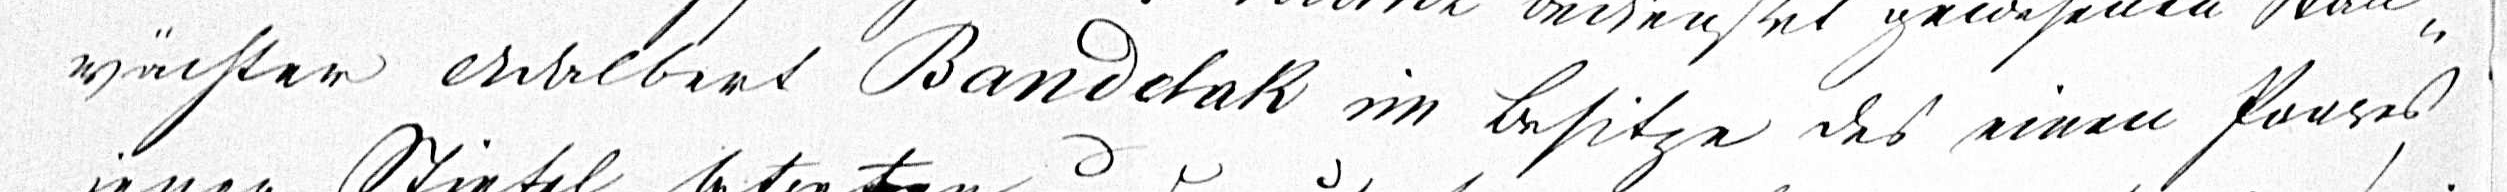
wächter Adalbert Bandelak im Besitze des einen Paares
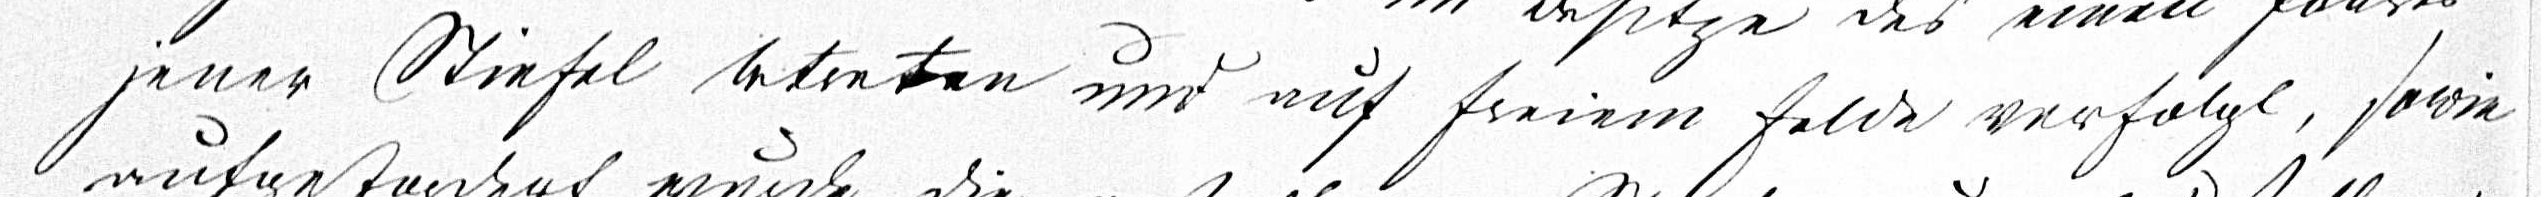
jener Stiefel betreten und auf freiem Felde verfolgt, sowie
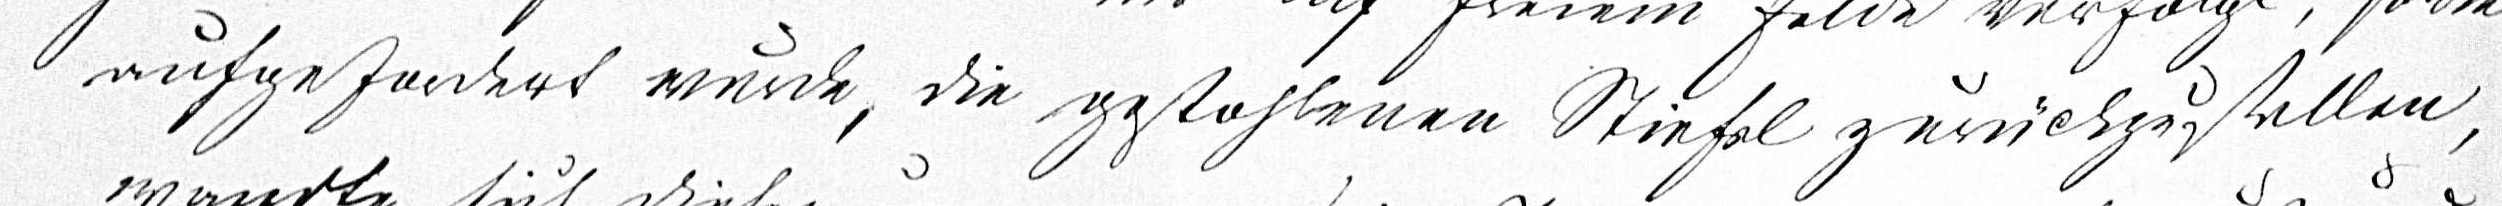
aufgefordert wurde, die gestohlenen Stiefel zurückzustellen,
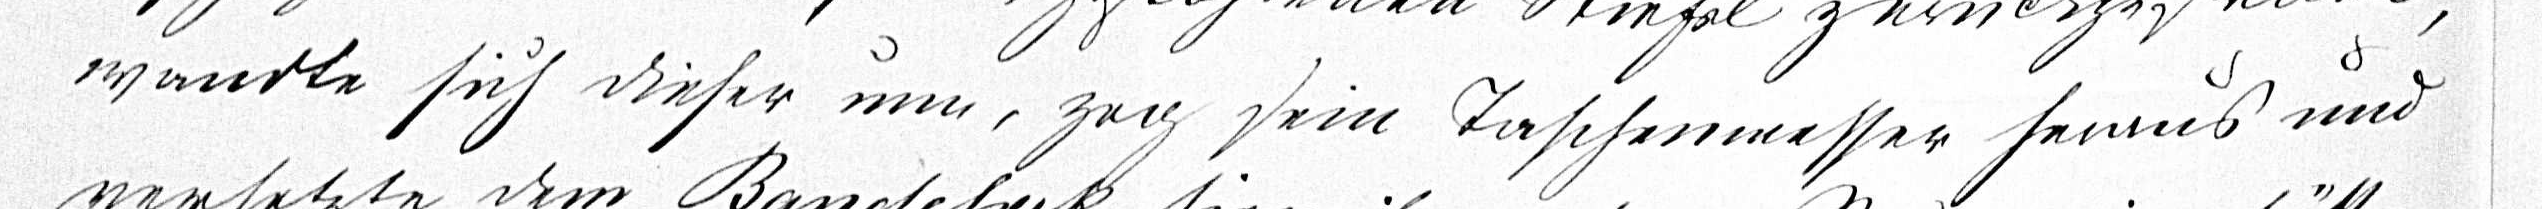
wandte sich dieser um, zog sein Taschenmesser heraus und
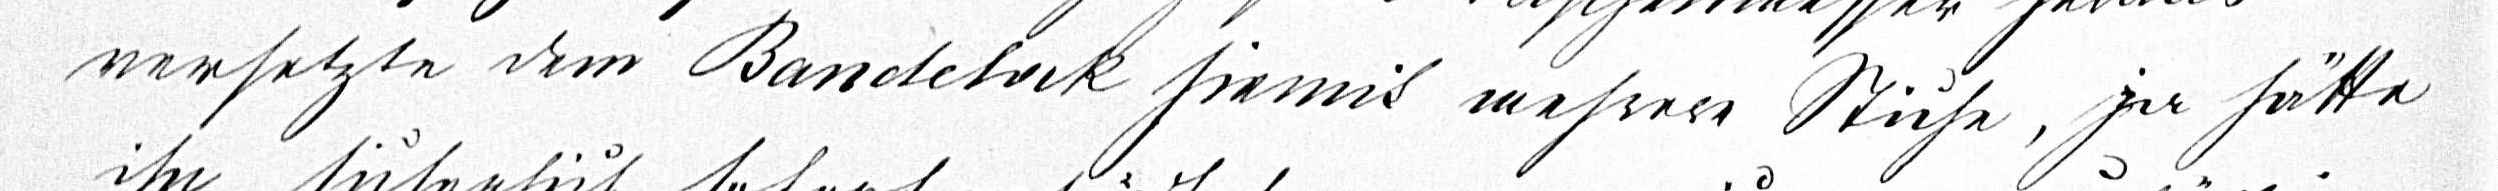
versetzte dem Bandelak hiemit mehrere Stiche, ja hätte
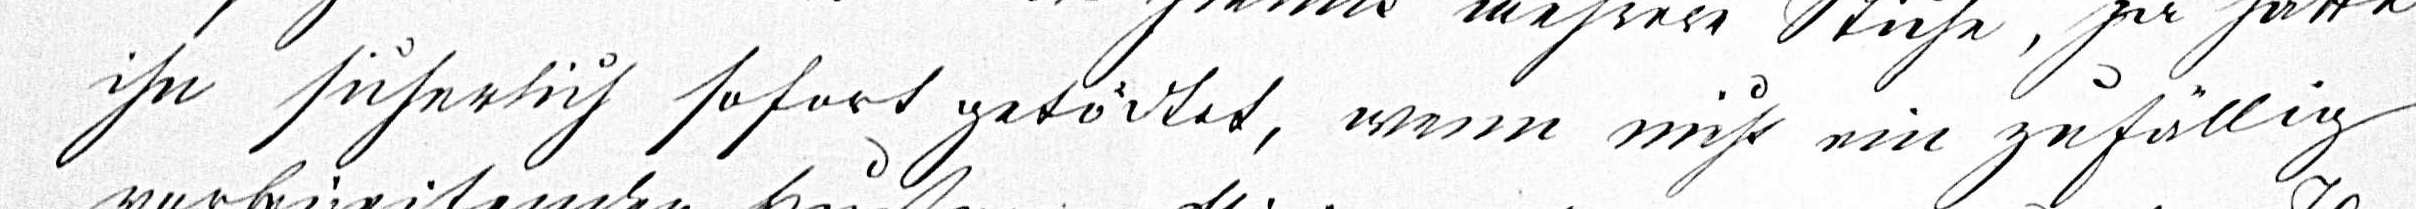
ihn sicherlich sofort getödtet, wenn nicht ein zufällig
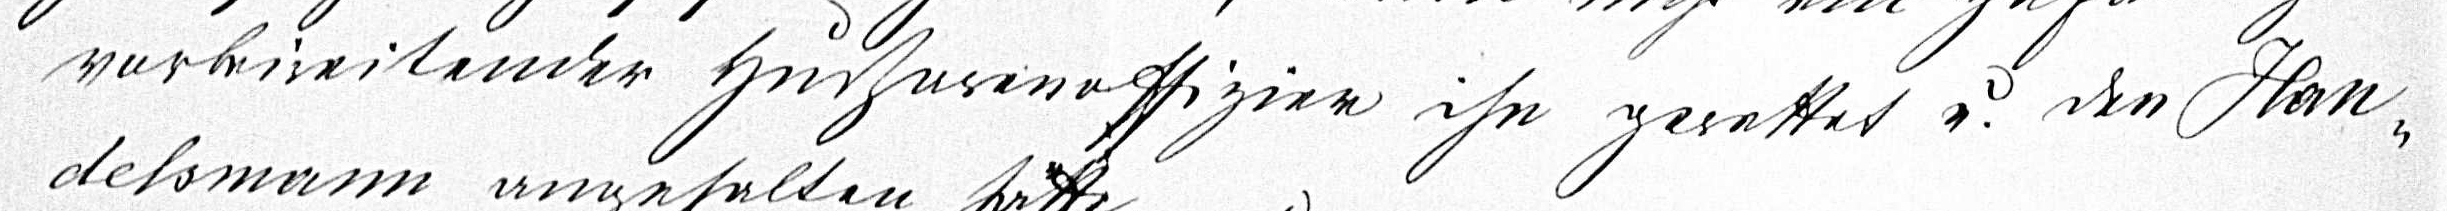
vorbeireitender Hußarenoffizier ihn gerettet u den Han¬
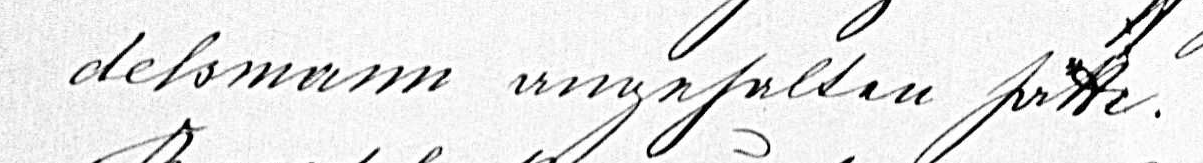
delsmann angehalten hatte.
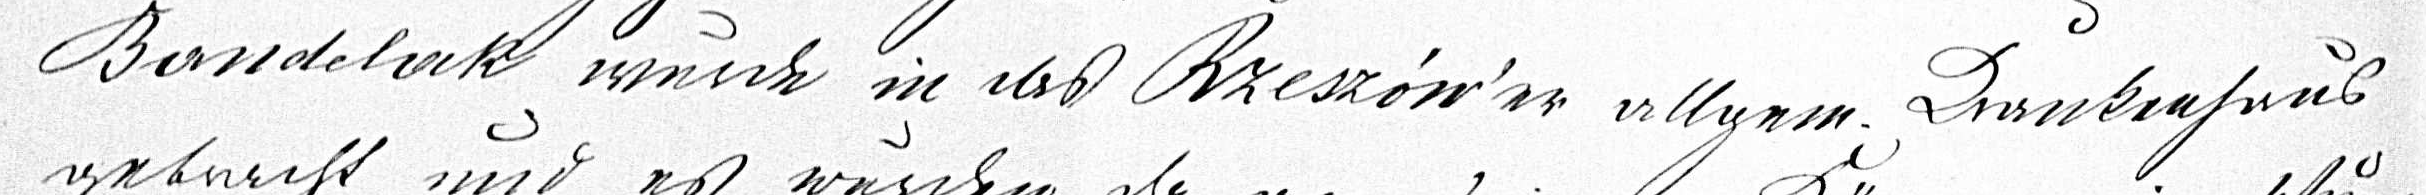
Bandelak wurde in des Rzeszów’er allgem. Krankenhaus
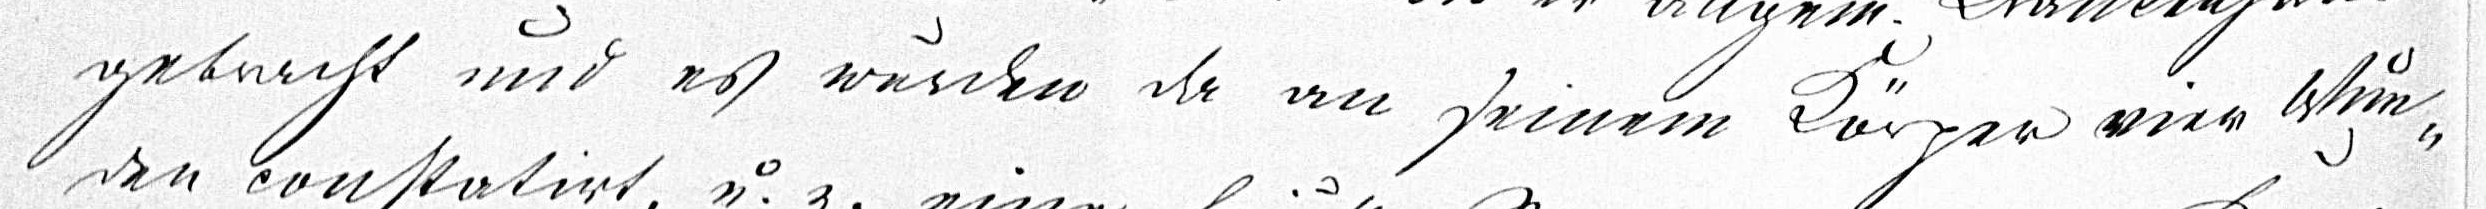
gebracht und es wurden da an seinem Körper vier Wun¬
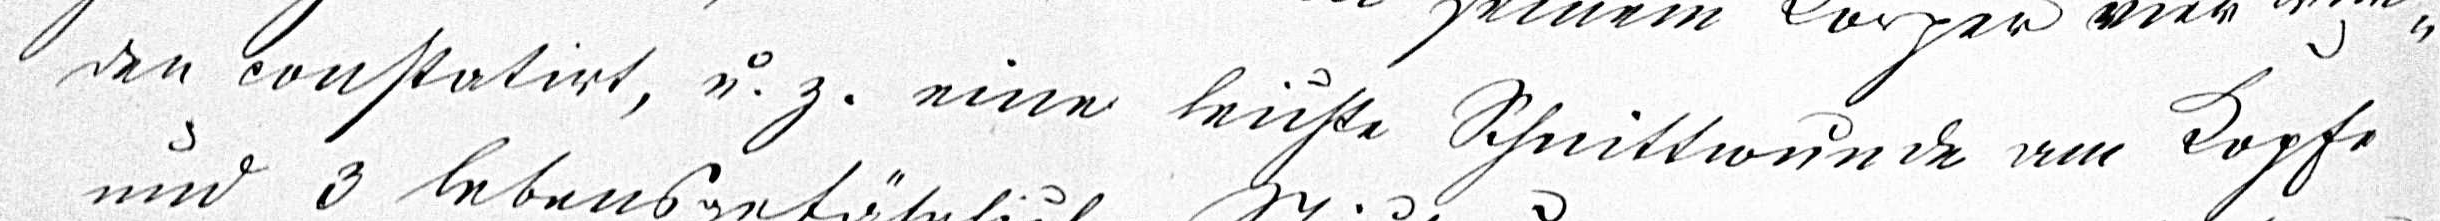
den constatirt, u.z. eine leichte Schnittwunde am Kopfe
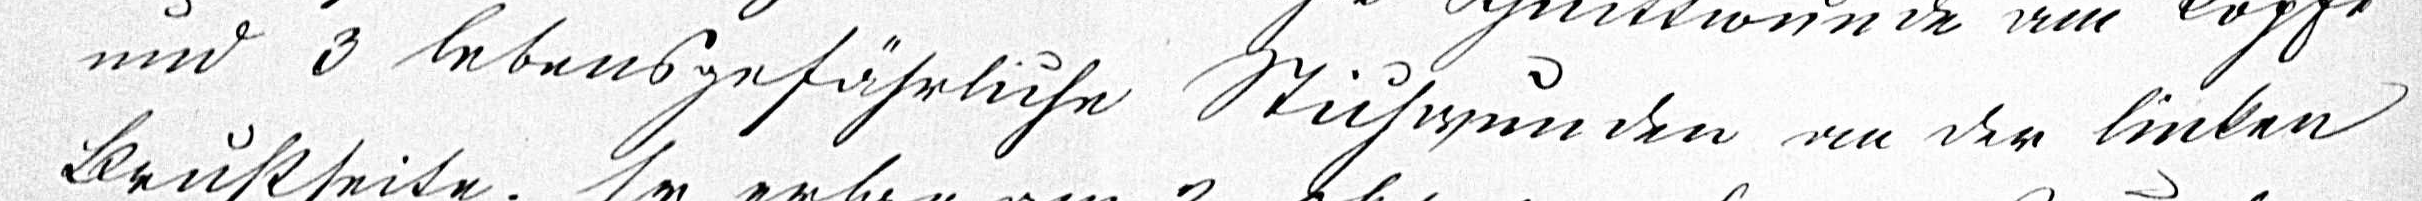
und 3 lebensgefährliche Stichwunden an der linken
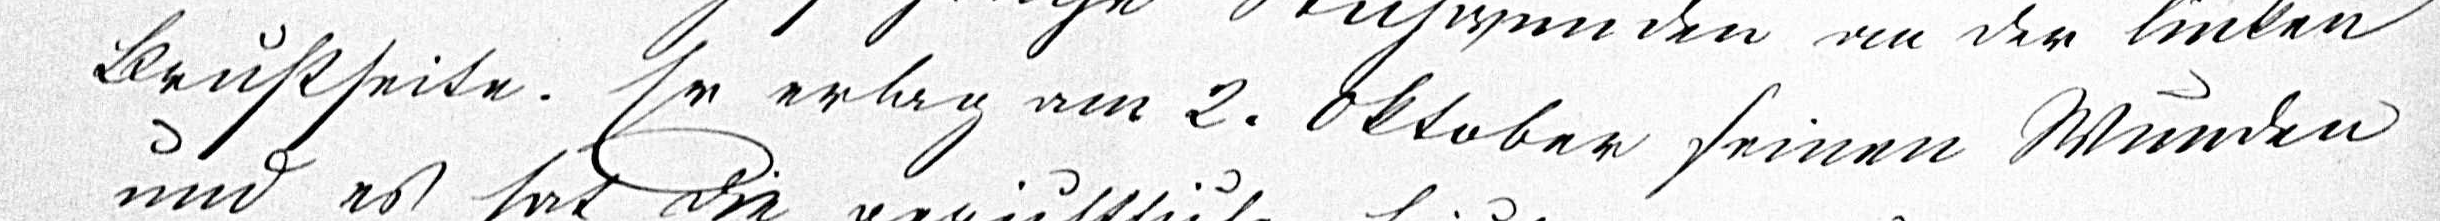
Brustseite. Er erlag am 2. Oktober seinen Wunden
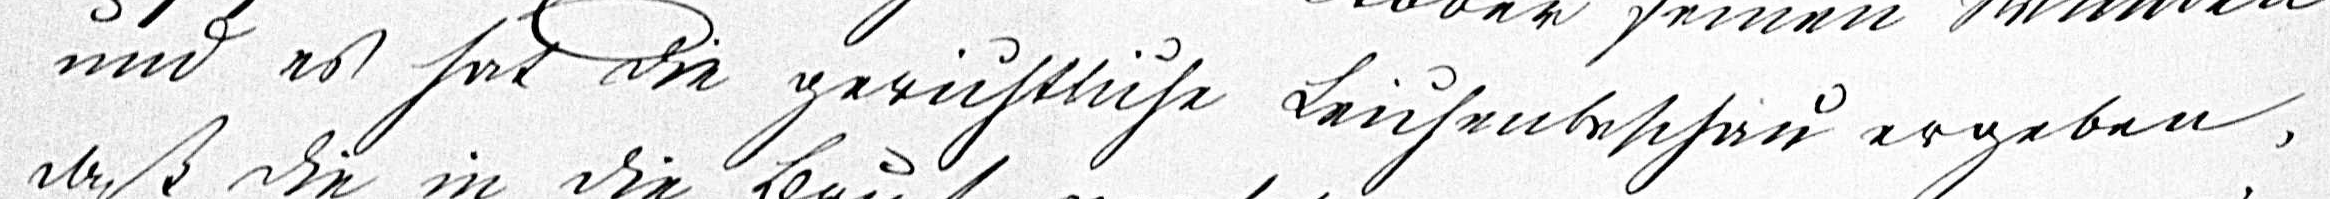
und es hat die gerichtliche Leichenbeschau ergeben,
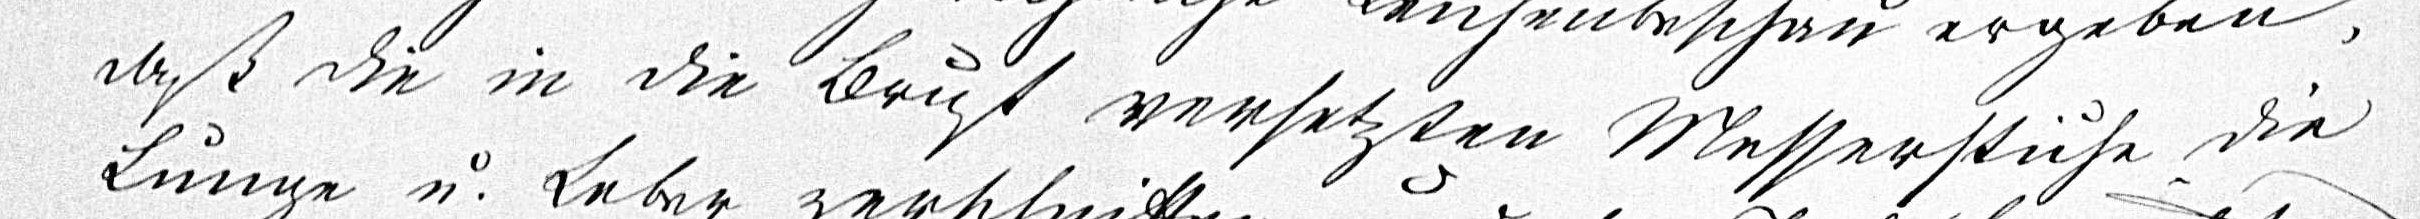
daß die in die Brust versetzten Messerstiche die
